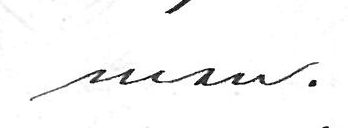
men.
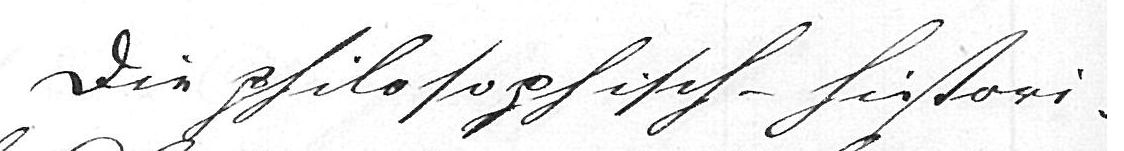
Die philosophisch-histori-
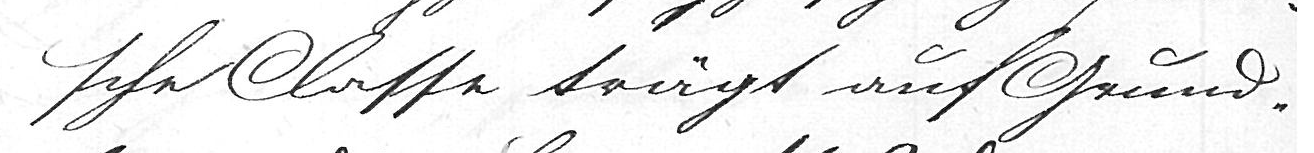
sche Classe trägt auf Grund-
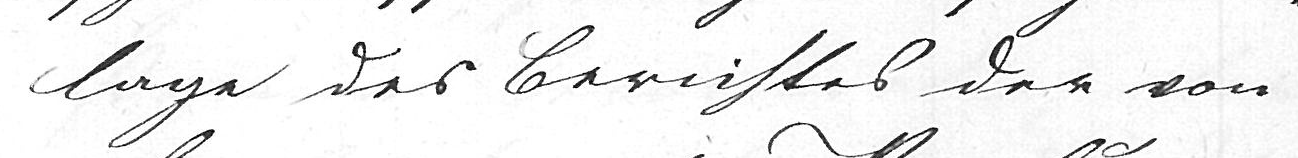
lage des Berichtes der von
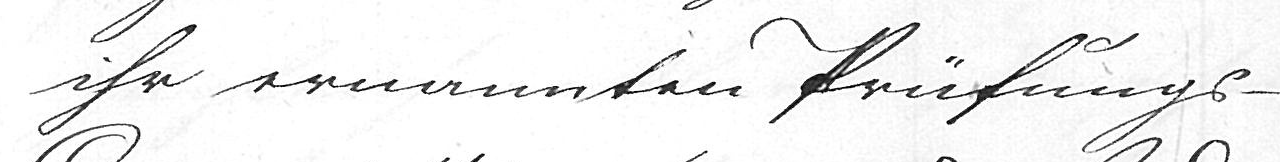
ihr ernannten Prüfungs-
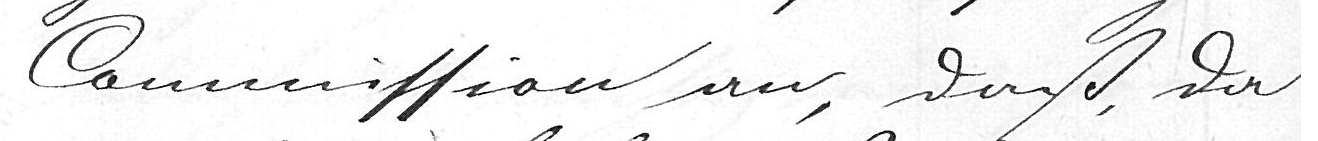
Commission an, daß da
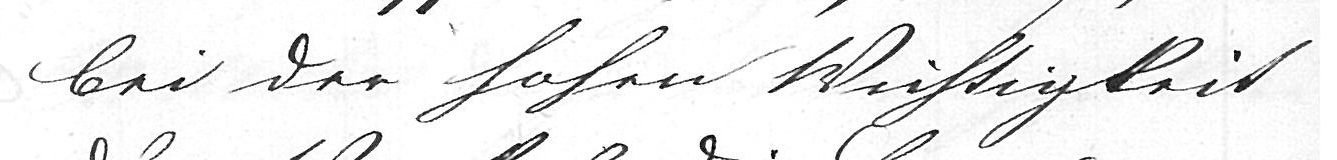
bei der hohen Wichtigkeit
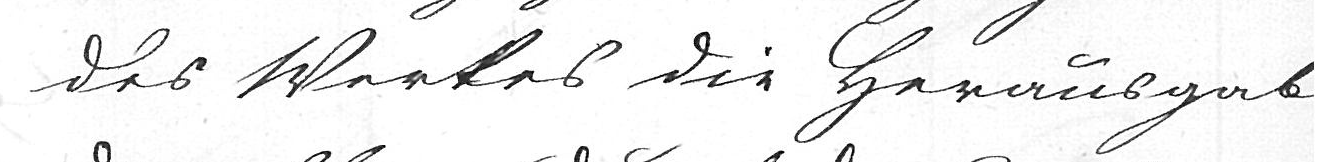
des Werkes die Herausgabe
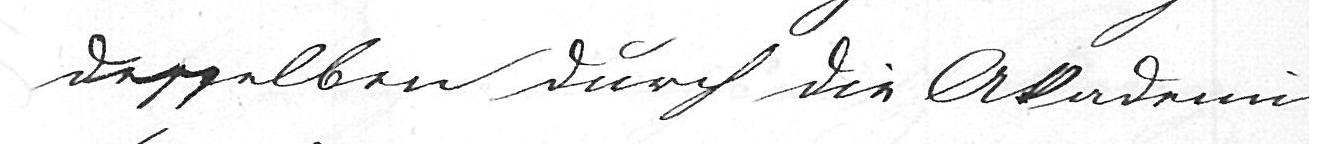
desselben durch die Akademie
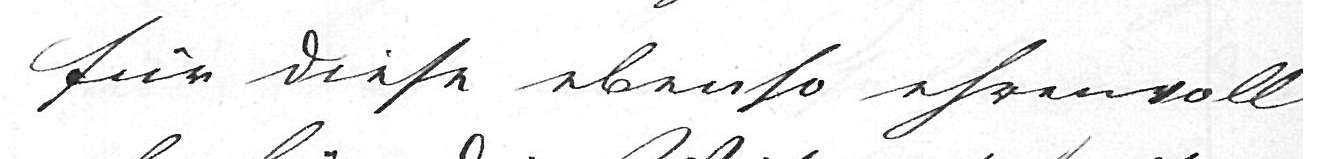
für diese ebenso ehrenvoll
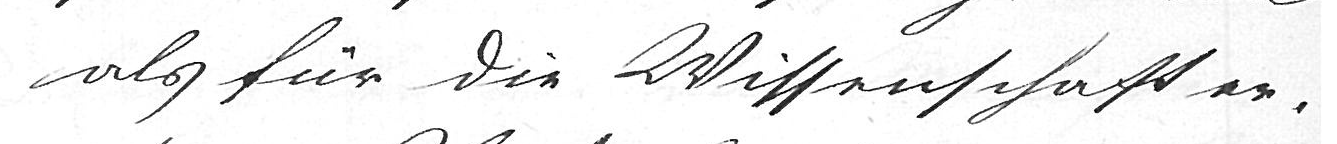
als für die Wissenschaft er-
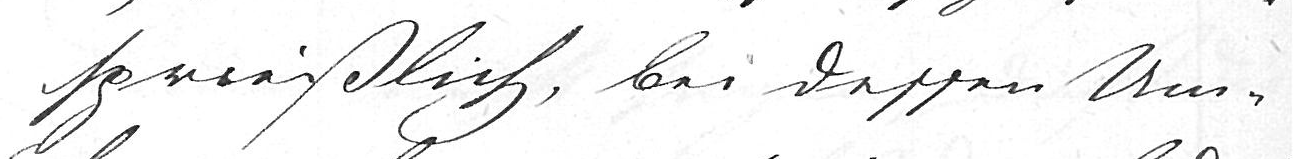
sprießlich, bei dessen Um-
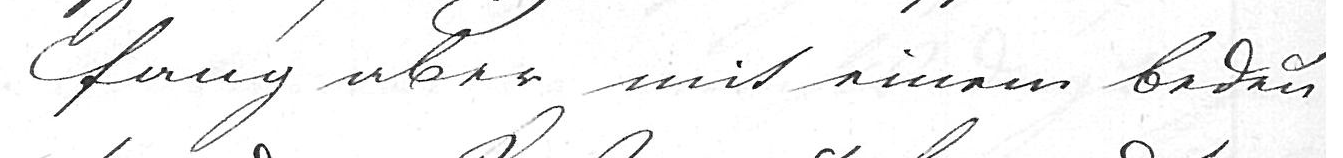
fang aber mit einem bedeu-
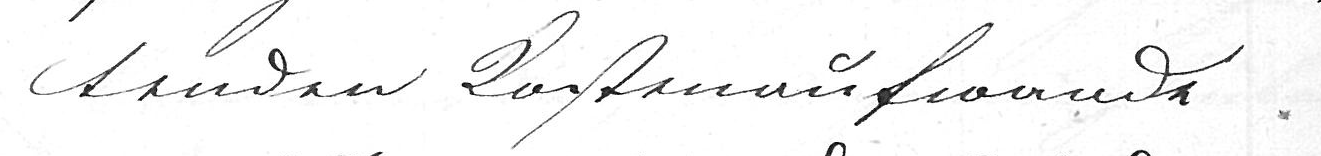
tenden Kostenaufwande
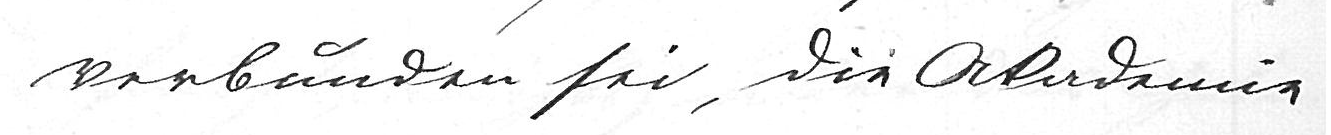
verbunden sei, die Akademie
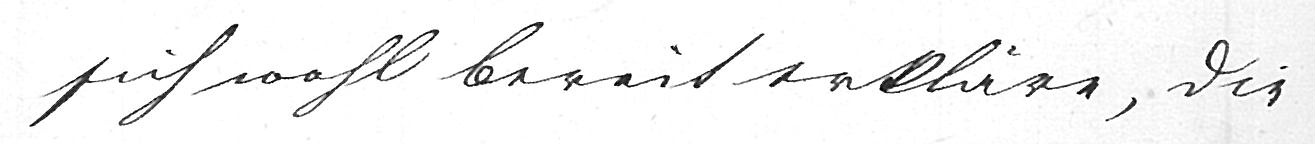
sich wohl bereit erkläre, die
